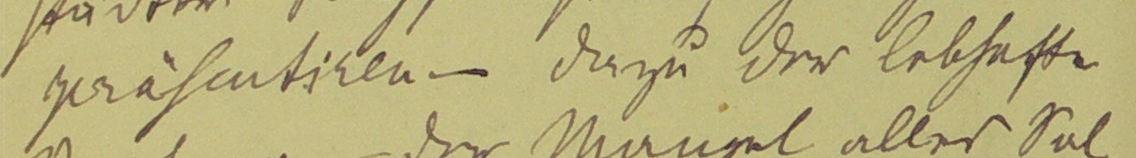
präsentieren-- dazu der lebhafte
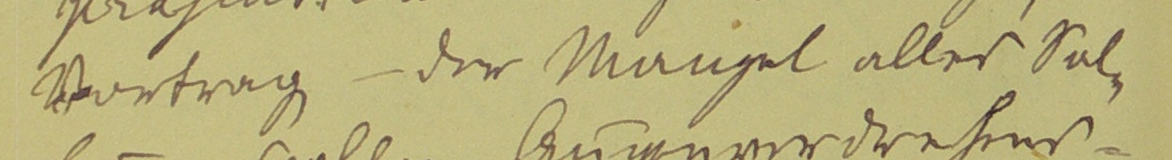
Vortrag.--Der Mangel aller sal¬
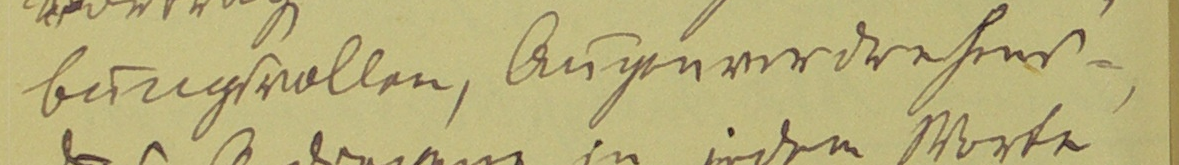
bungsvollen, augenverdrehens,
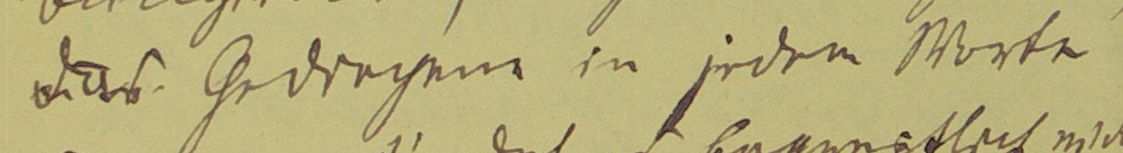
das Gediegene in jedem Worte
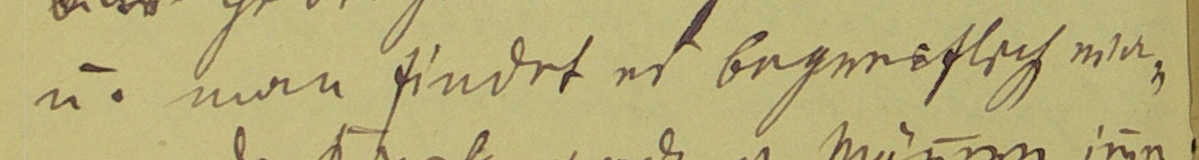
und man findet es begreiflich wa¬
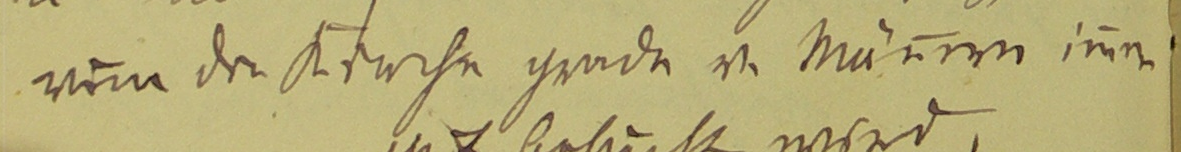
rum die Kirche grade von Männern immer so
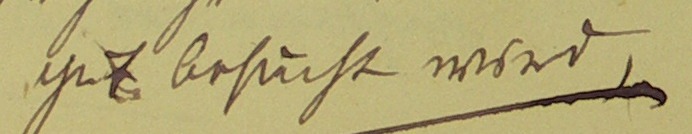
gut besucht wird
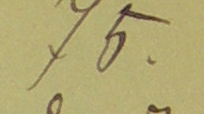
75
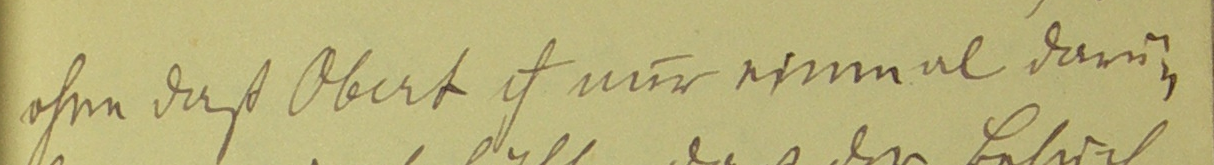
ohne das Obert auch nur einmal darü¬
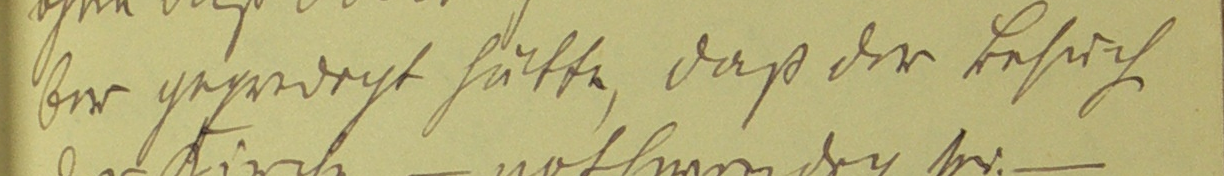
ber gepredigt hätte, daß der Besuch
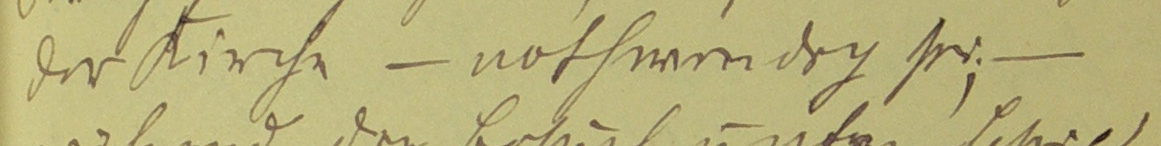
der Kirche-notwendig sei.-
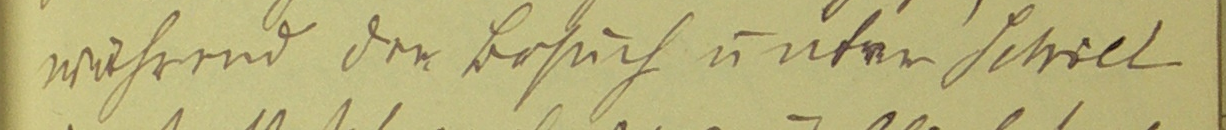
während der Besuch unter Schiel
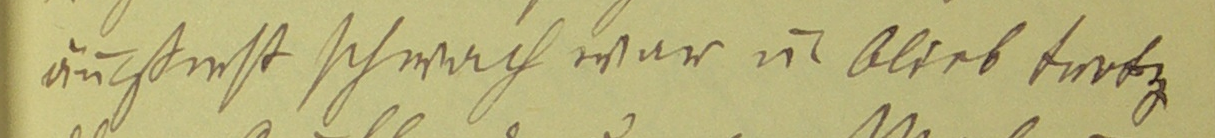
äußerst schwach war und blieb, trotz
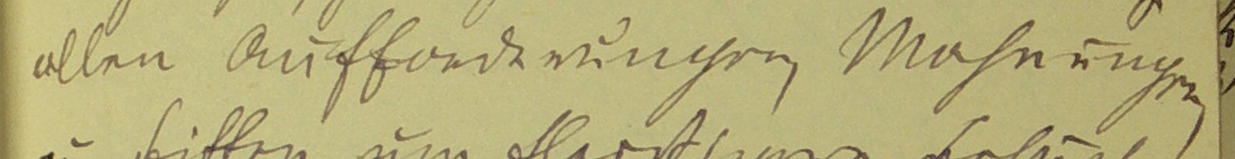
allen Aufforderungen, Mahnungen
